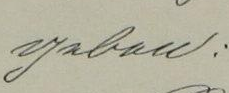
geben:
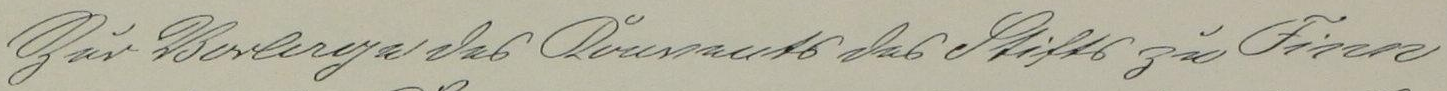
Zur Vorlage des Konvents des Stifts zu Finn
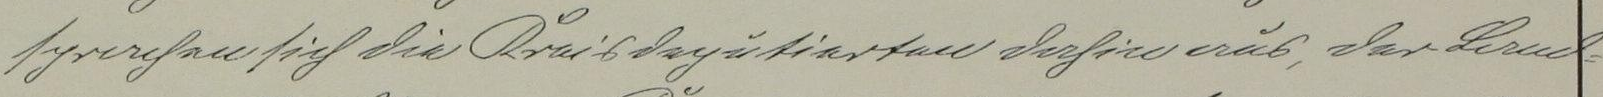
sprachen sich die Kreisdeputierten dahin aus, der Land-
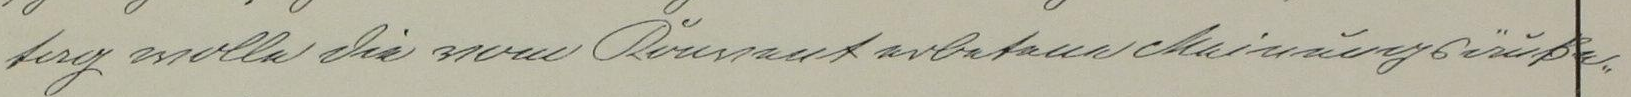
tag wolle die vom Konvent erbetene Meinungsäuße-
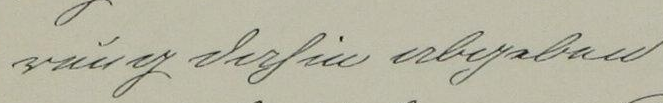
rung dahin abgeben
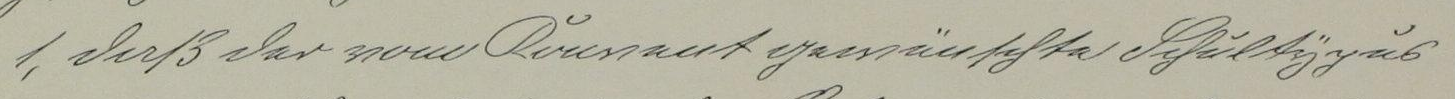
1. daß der vom Konvent gewünschte Schultypus
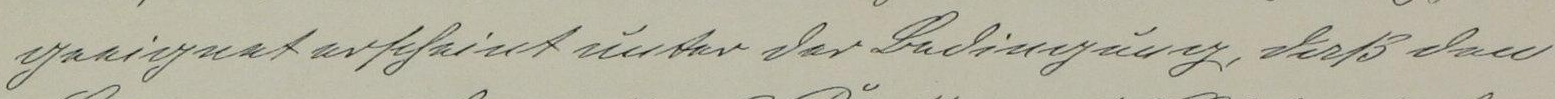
geeignet erscheint unter der Bedingung, daß den
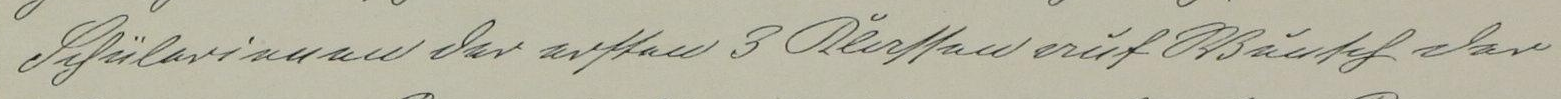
Schülerinnen der ersten 3 Klassen auf Wunsch der
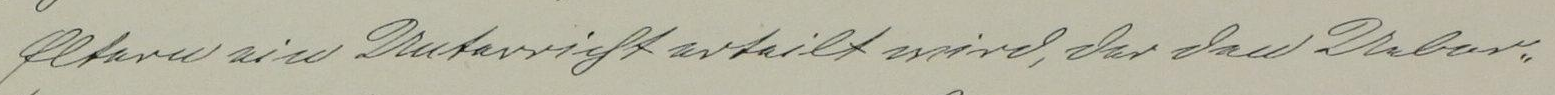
Eltern ein Unterricht erteilt wird, der den Ueber-
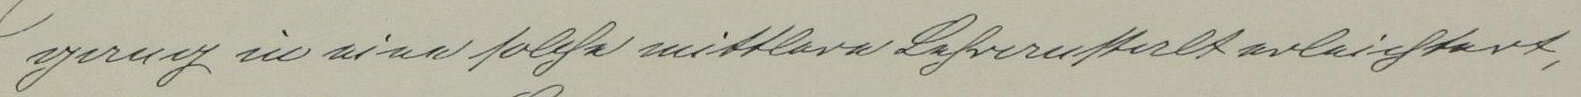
gang in eine solche mittlere Lehranstalt erleichtert,
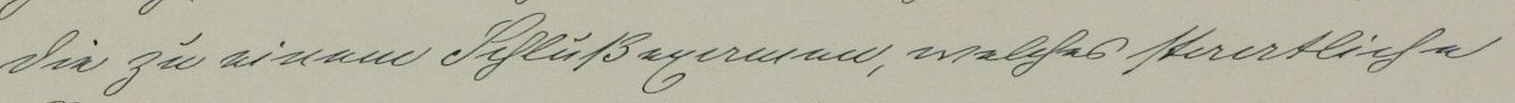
die zu einem Schlußexamen, welches staatliche
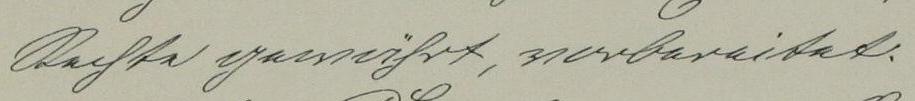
Rechte gewährt, vorbereitet.
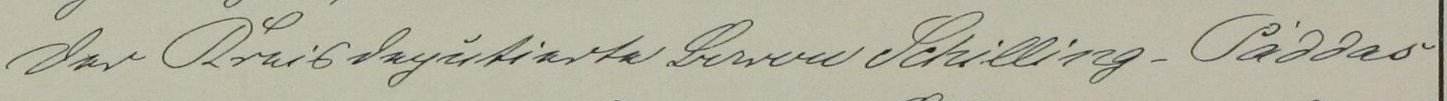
Der Kreisdeputierte Baron Schilling-Paddas
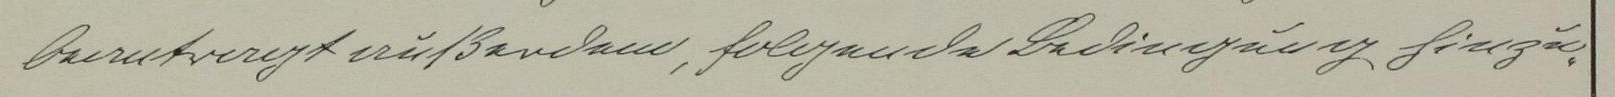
beantragt außerdem, folgende Bedingung hinzu-
